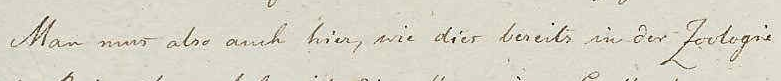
Man mus also auch hier, wie dies bereits in der Zoologie
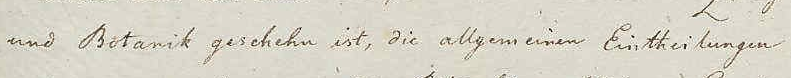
und Botanik geschehn ist, die allgemeinen Eintheilungen
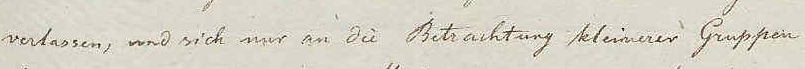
verlassen, und sich nur an die Betrachtung kleinerer Gruppen
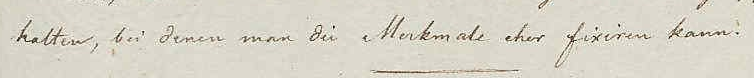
halten, bei denen man die Merkmale eher fixiren kann.
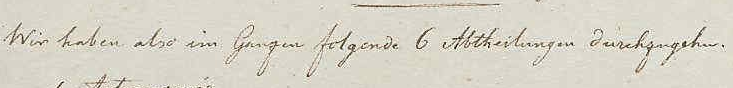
Wir haben also im Ganzen folgende 6 Abtheilungen durchzugehn.
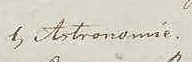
1, Astronomie.
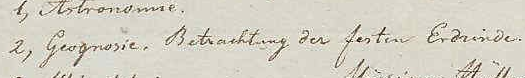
2, Geognosie. Betrachtung der festern Erdrinde.
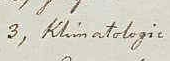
3, Klimatologie ―
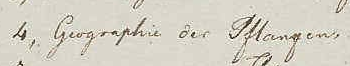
4, Geographie der Pflanzen.
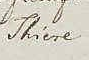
― Thiere.
